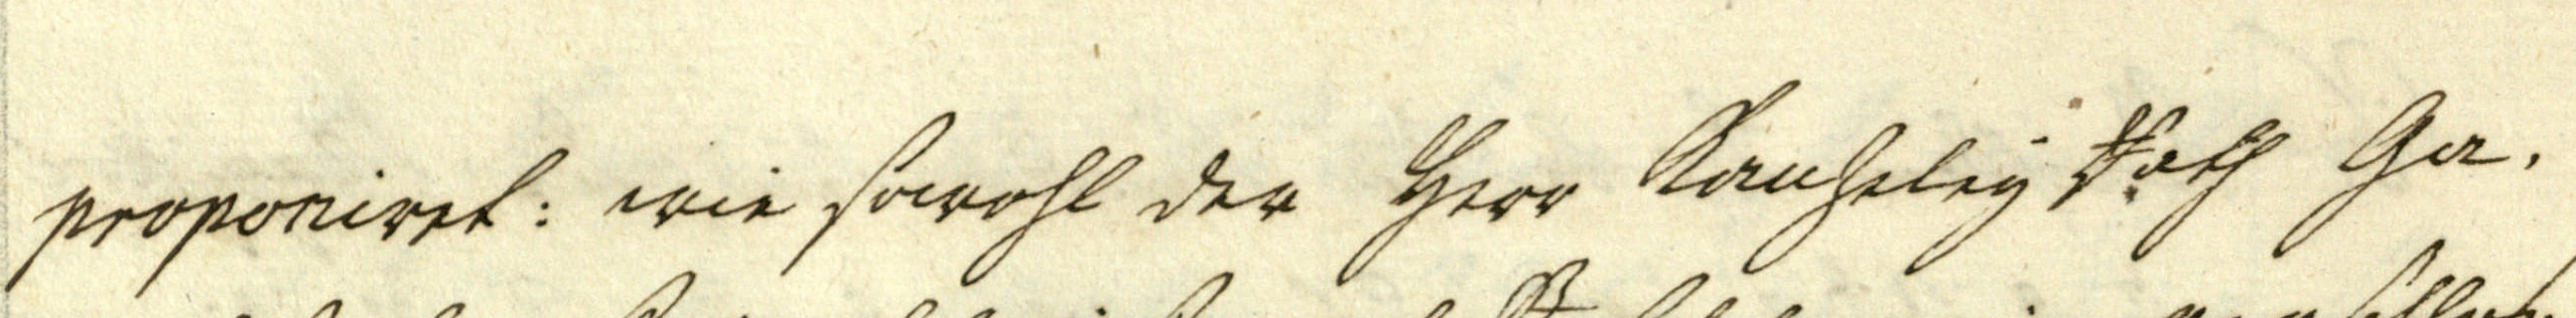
proponiret: wie sowohl der Herr Kanzeleÿ Rath Ga¬
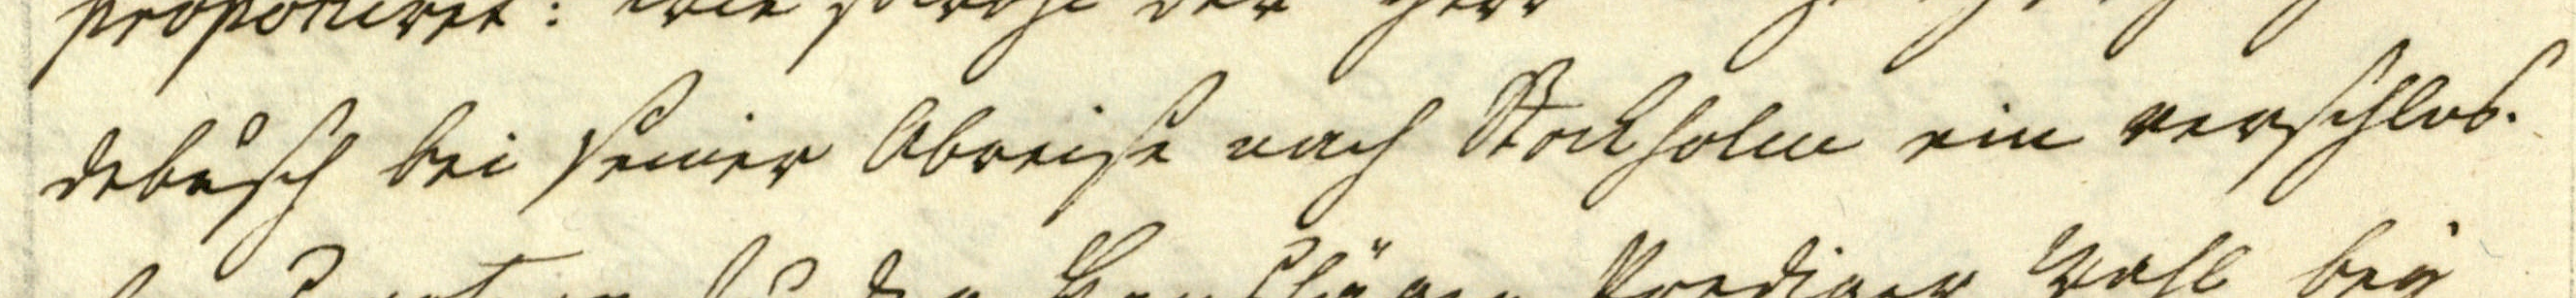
debusch bei seiner Abreise nach Stockholm ein verschlos¬
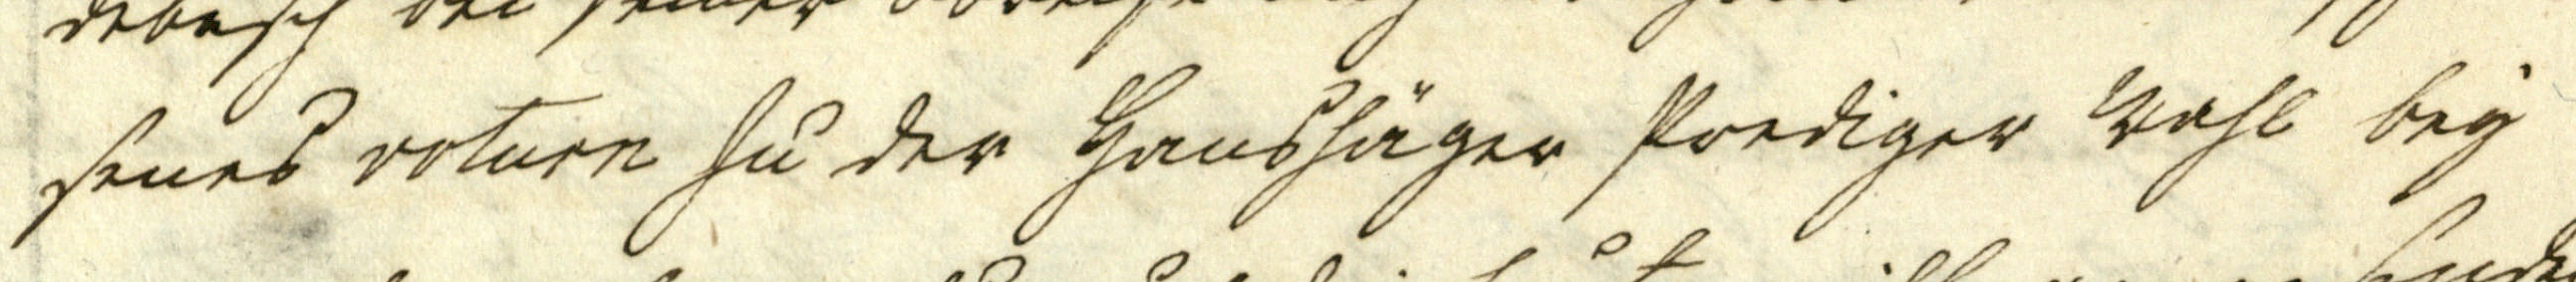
senes votum zu der Hanshäger Prediger Wahl beÿ
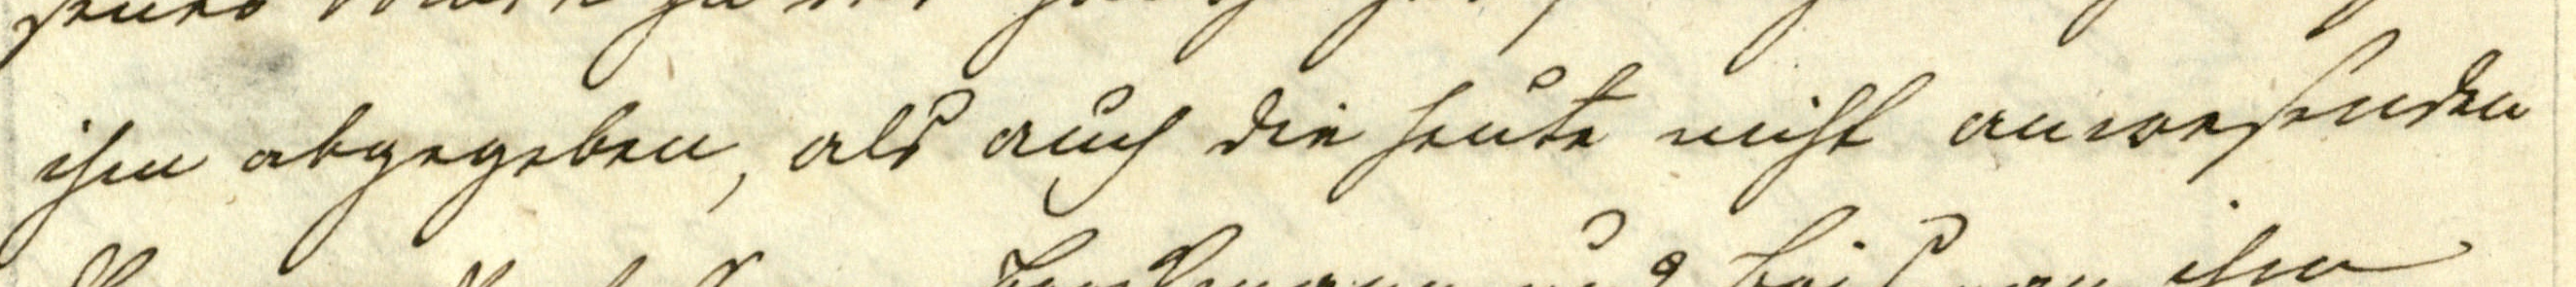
ihm abgegeben, als auch die heute nicht anwesenden
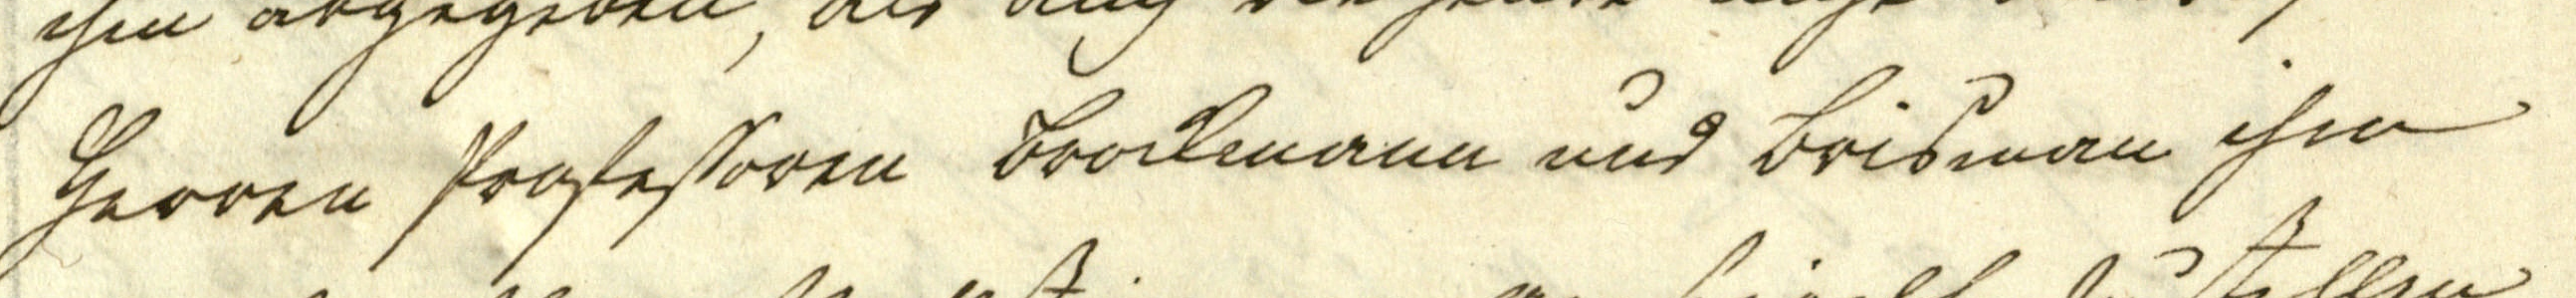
Herren Professoren Brockmann und Brisman ihm
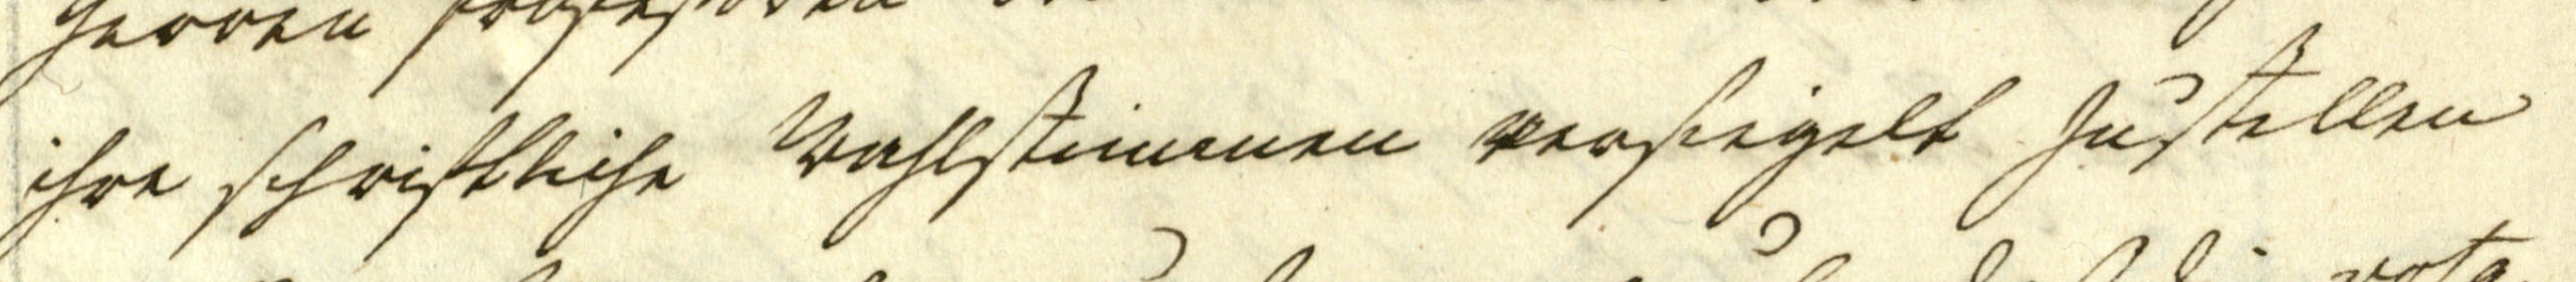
ihre schriftliche Wahlstimmen versiegelt zustellen
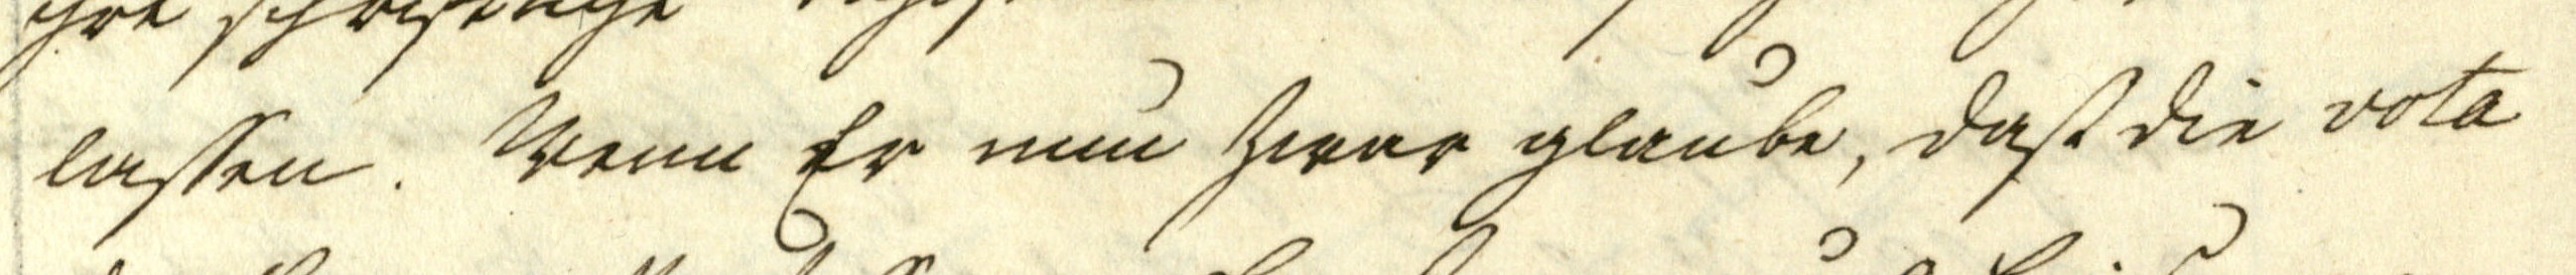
lassen. Wenn Er nun zwar glaube, daß die vota
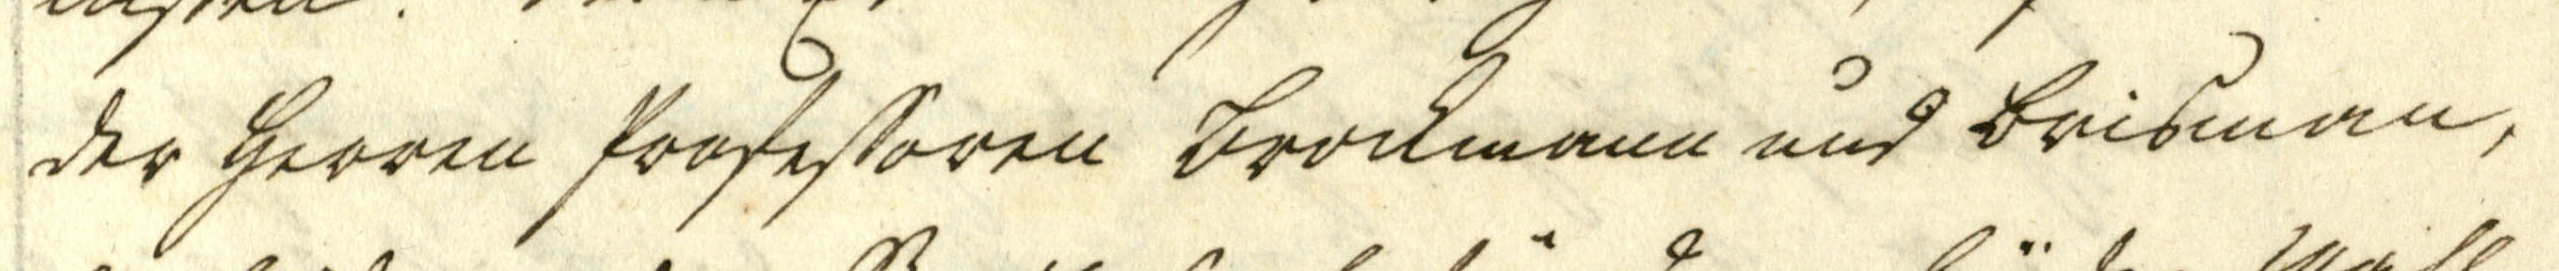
der Herren Professoren Brockmann und Brisman,
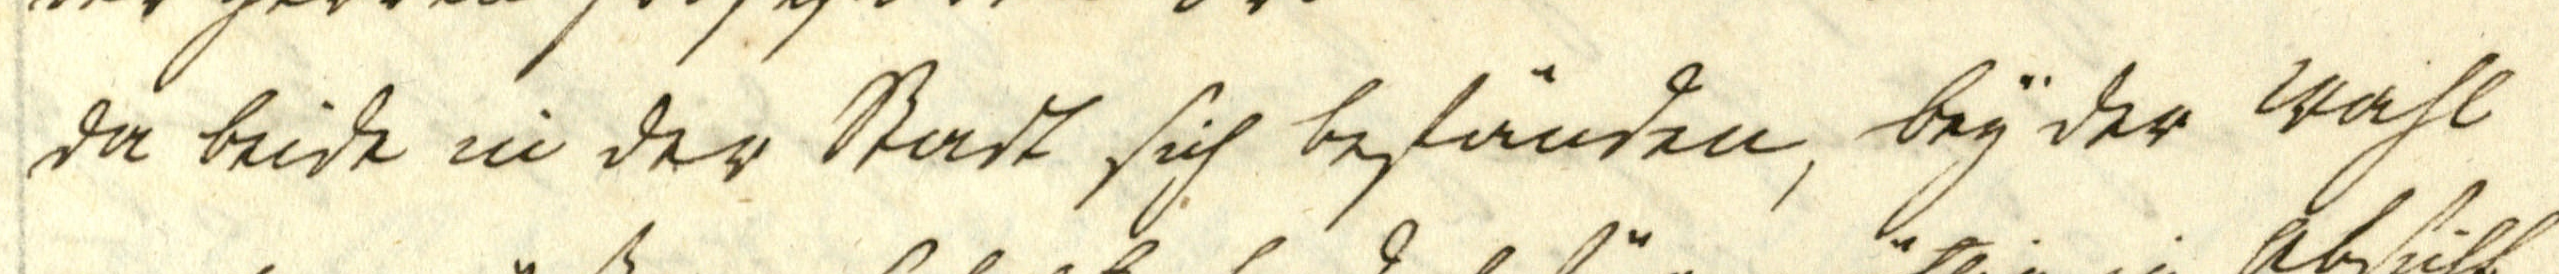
da beide in der Stadt sich befänden, beÿ der Wahl
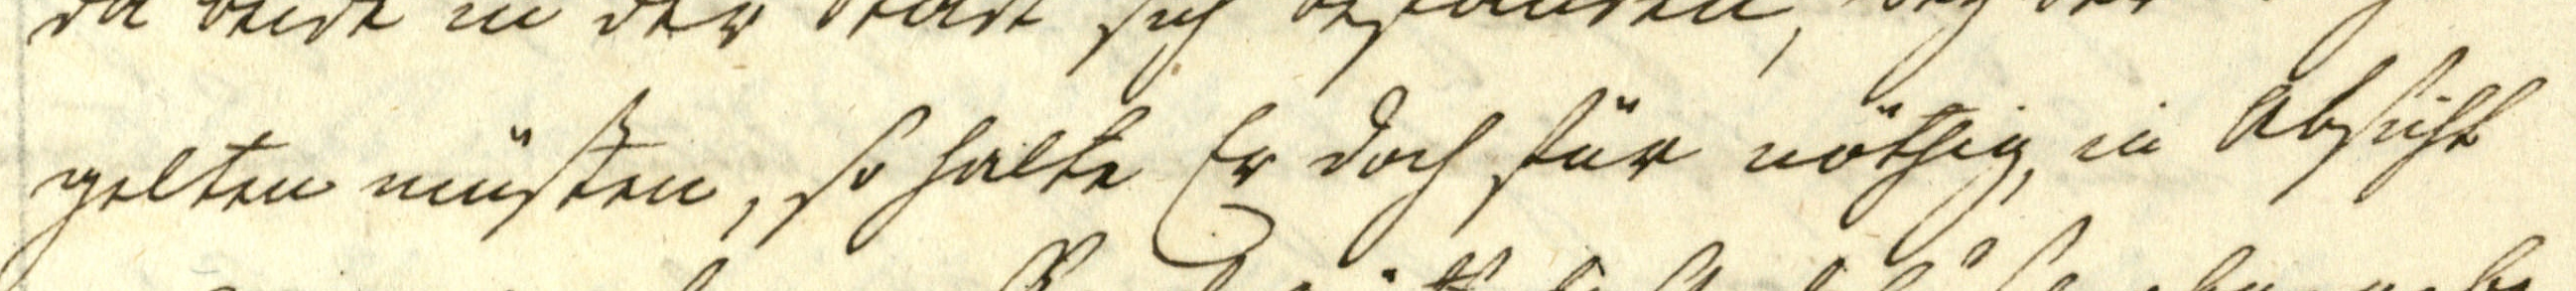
gelten müßten, so halte Er doch für nöthig, in Absicht
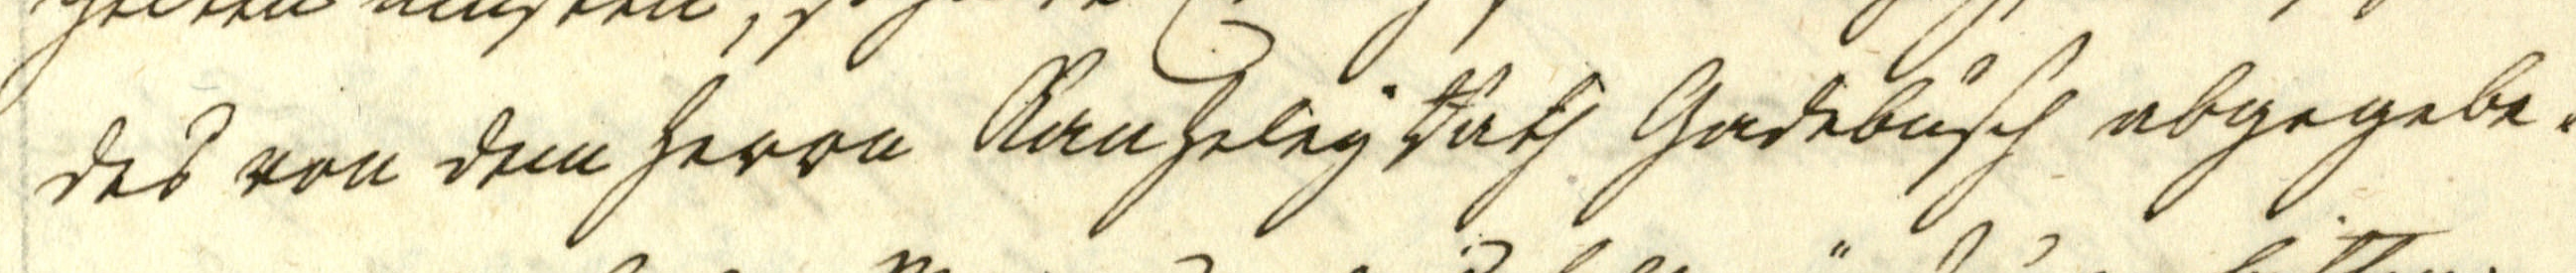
des von dem Herrn Kanzeley Rath Gadebusch abgegebe¬
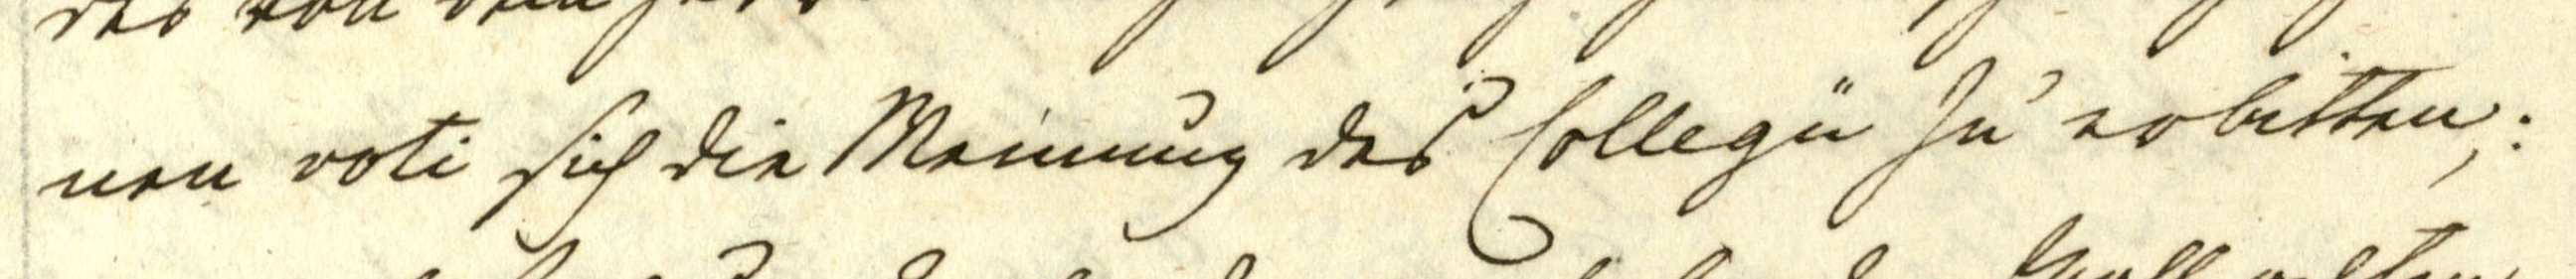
nen voto sich die Meinung des Collegii zu erbitten,
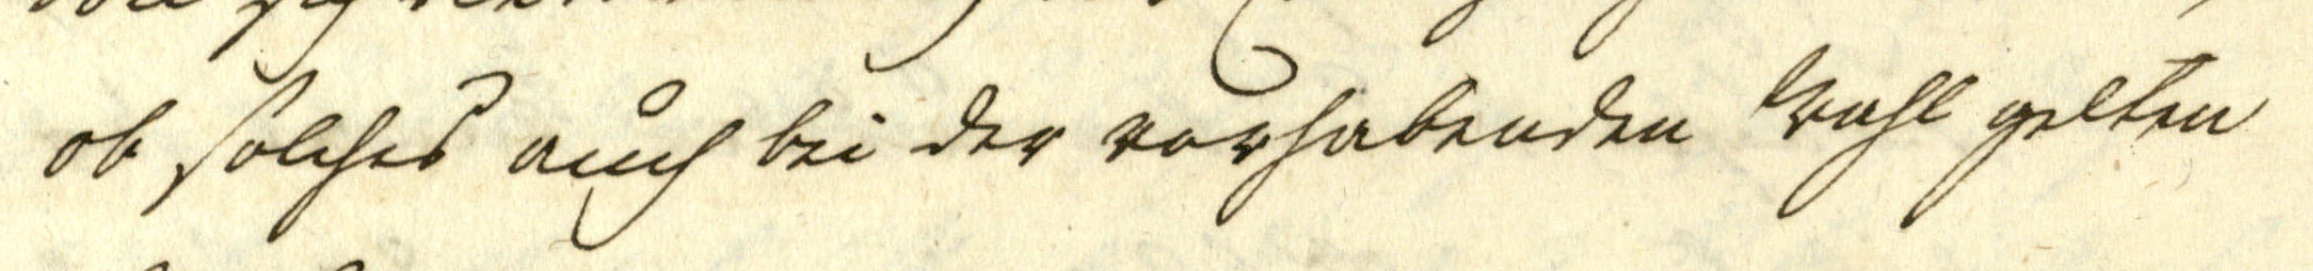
ob solches auch bei der vorhabenden Wahl gelten
